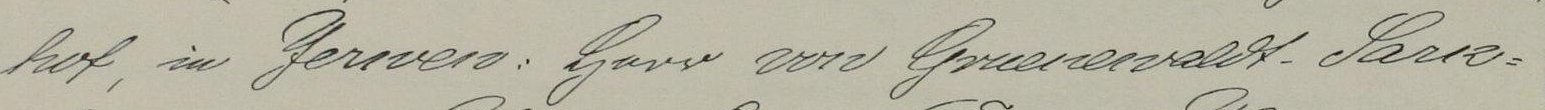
hof, in Jerwen: Herr von Gruenewaldt-Sark-
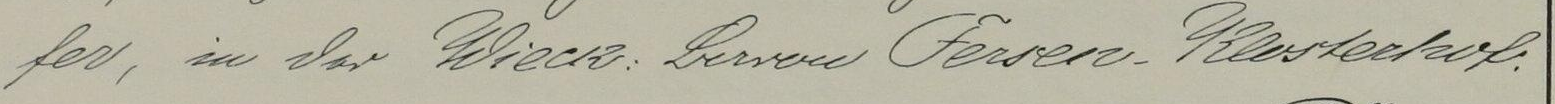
fer, in der Wieck: Baron Fersen-Klosterhof.
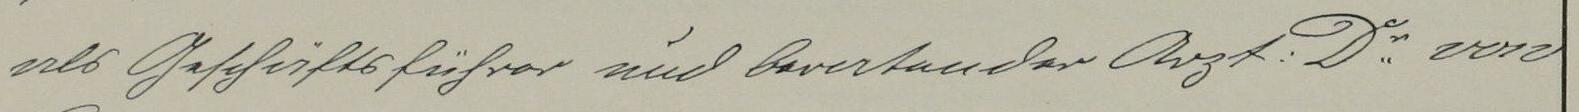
als Geschäftsführer und beratender Arzt: Dr. von
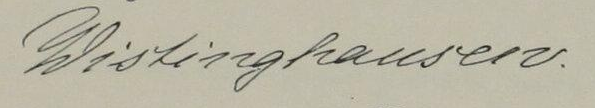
Wistinghausen.
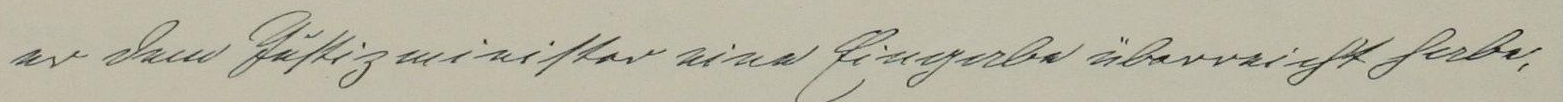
er dem Justizminister eine Eingabe überreicht habe,
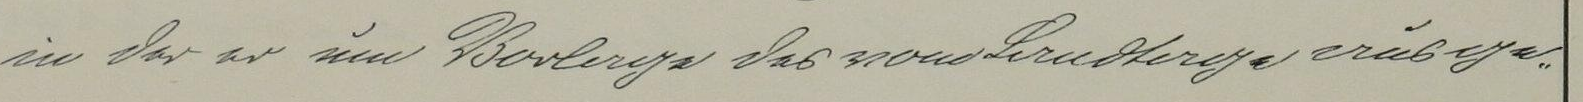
in der er um Vorlage des vom Landtage ausge-
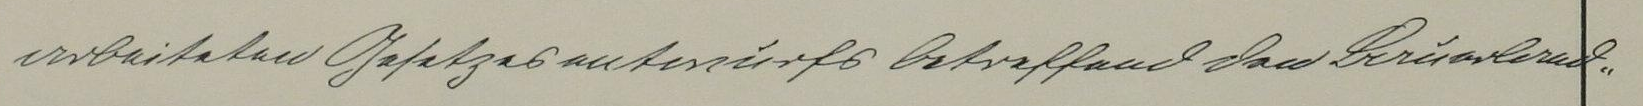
arbeiteten Gesetzesentwurfs betreffend den Bauerland-
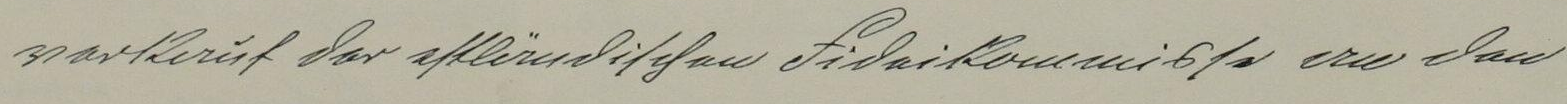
verkauf der estländischen Fideikommisse an den
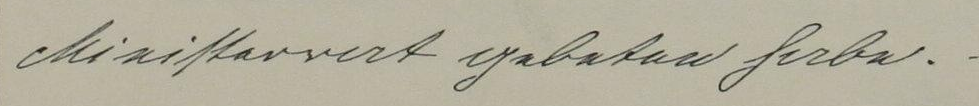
Ministerrat gebeten habe.
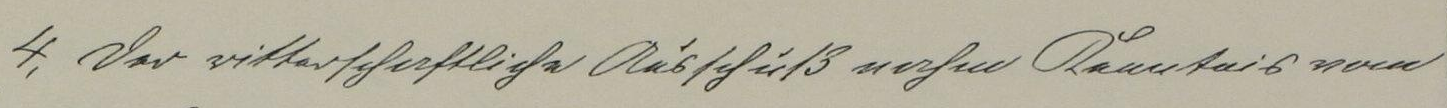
4. Der ritterschaftliche Ausschuß nahm Kenntnis vom
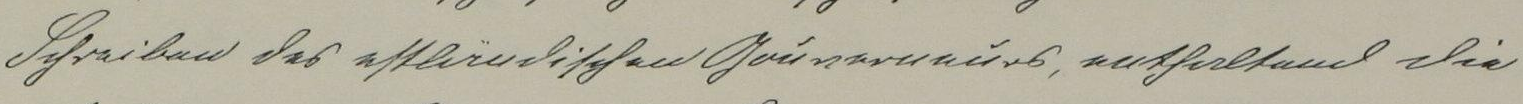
Schreiben des estländischen Gouverneurs, enthaltend die
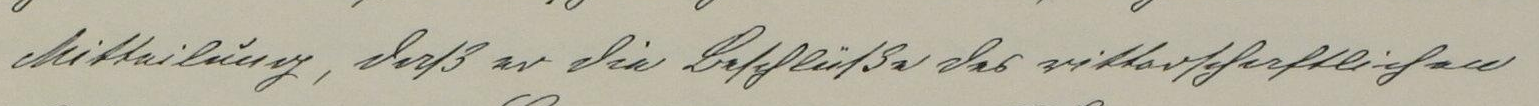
Mitteilung, daß er die Beschlüße des ritterschaftlichen
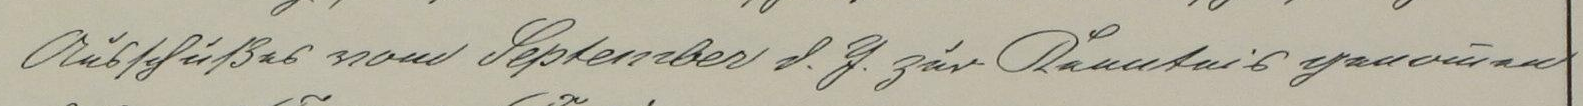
Ausschußes vom September d.J. zur Kenntnis genommen
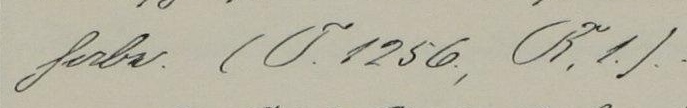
habe. (T.1256; R.1)
